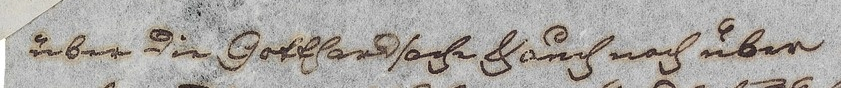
über die Gotthardsache & auch noch über
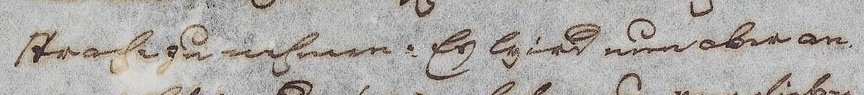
sprache zu nehmen. Es wird nun aber an-
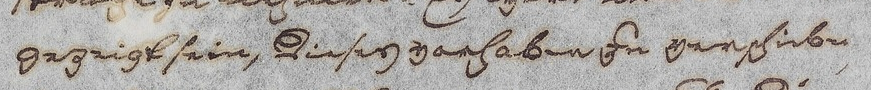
gezeigt sein, dieses Vorhaben zu verschieben,
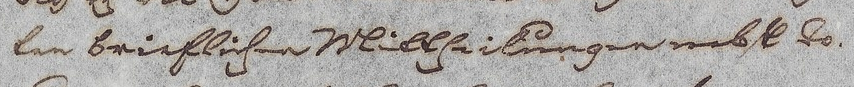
ten brieflichen Mittheilungen nebst Do-
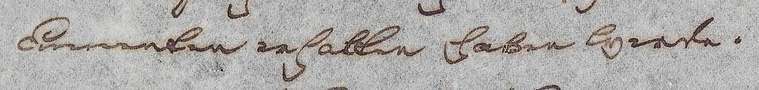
cumenten erhalten haben werde.
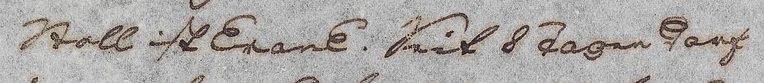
Stoll ist krank. Seit 8 Tagen darf
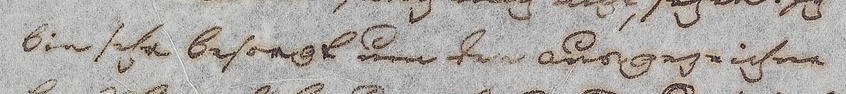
bin sehr besorgt um den ausgezeichne-
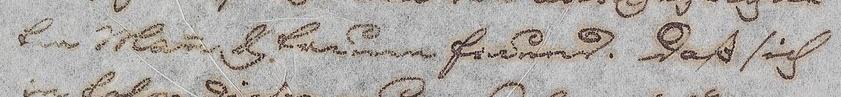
ten Mann & treuen Freund. Daß sich
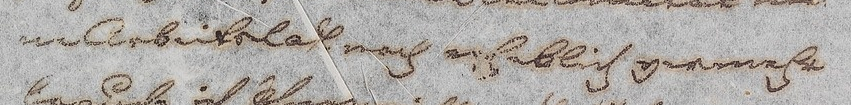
ne Arbeitslast noch erheblich vermehrt,
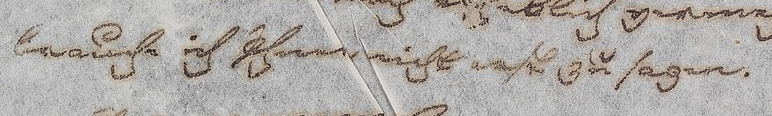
brauche ich Ihnen nicht erst zu sagen.
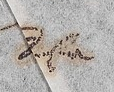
Escher
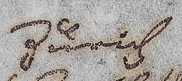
Zürich
